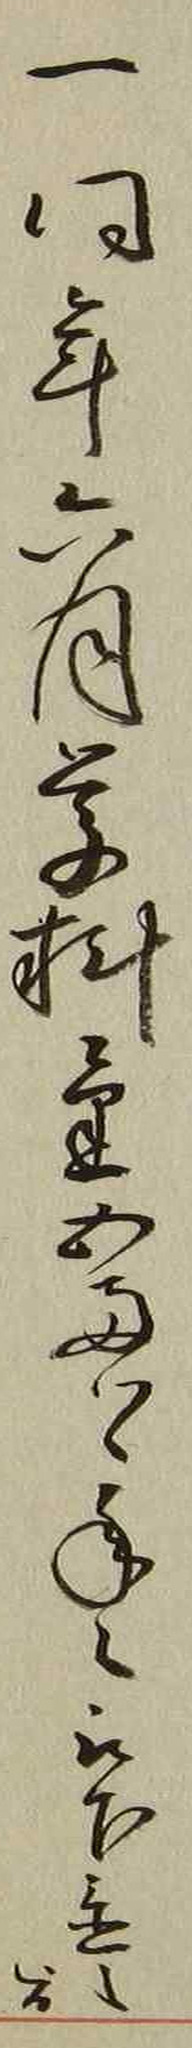一同年六月学料金五両ツヽ年々被下置候旨
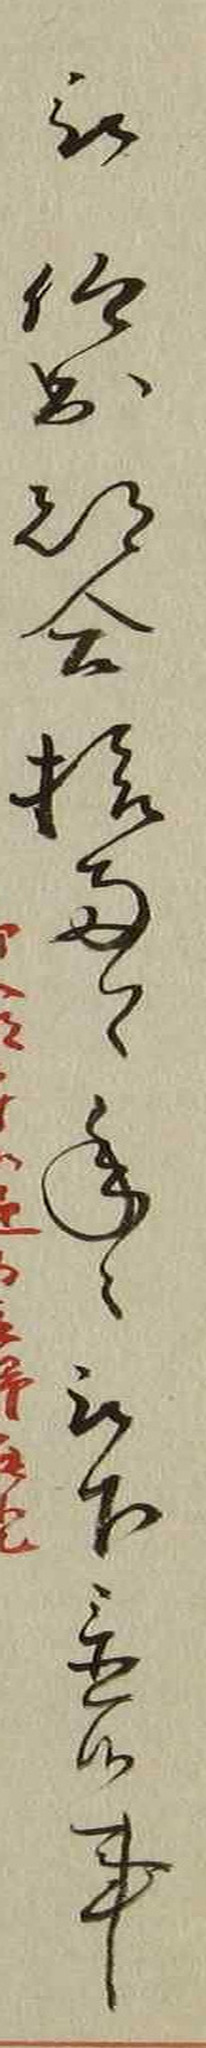被仰出都合拾両ツヽ年々被下置候事
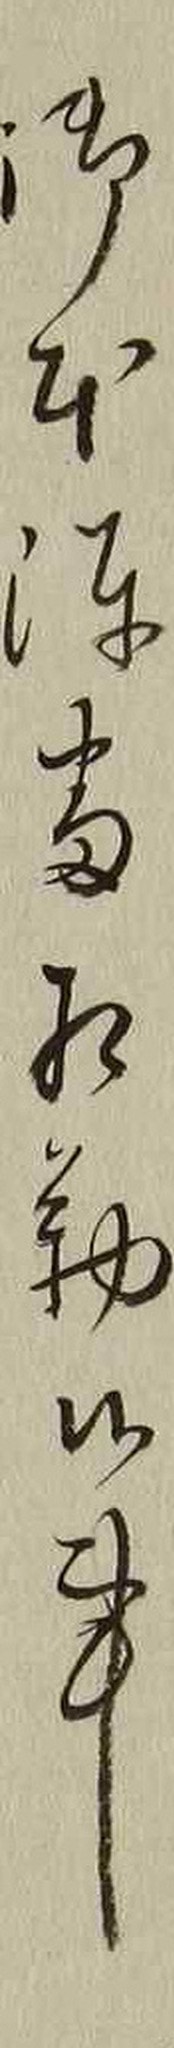御本陣番相勤候事
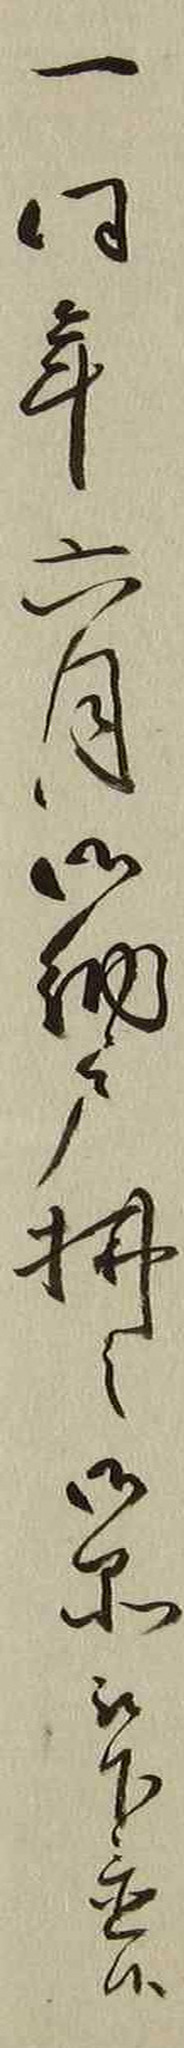一同年六月御納戸払之御品被下置候
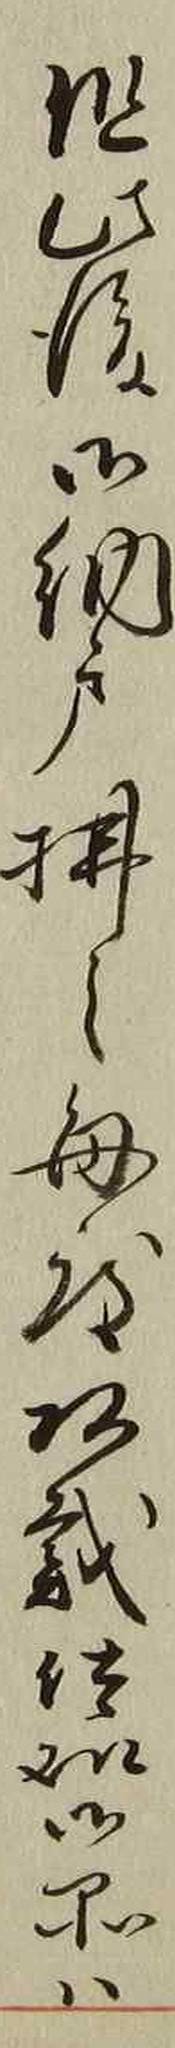但此後御納戸払之毎度頂戴仕候処御品は
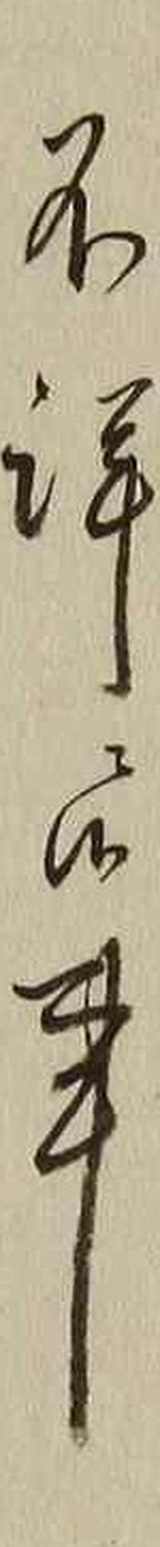不詳に候事
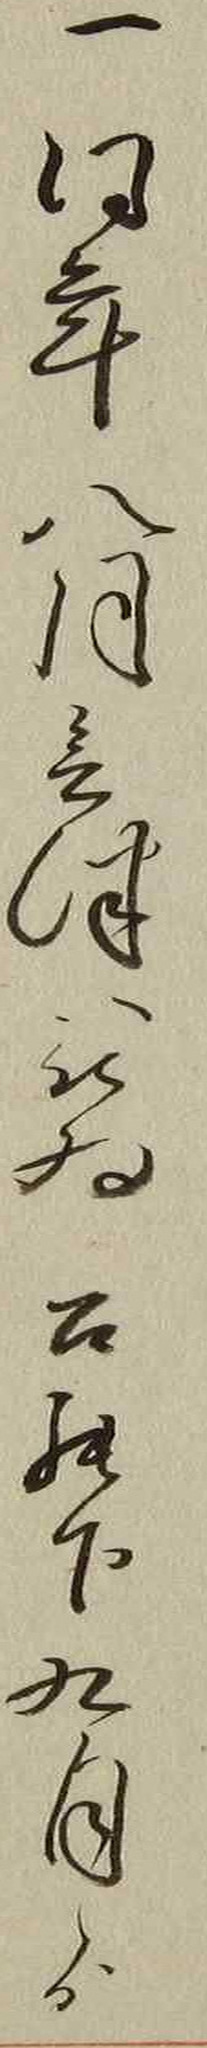一同年八月会津へ被為召罷下九月ゟ
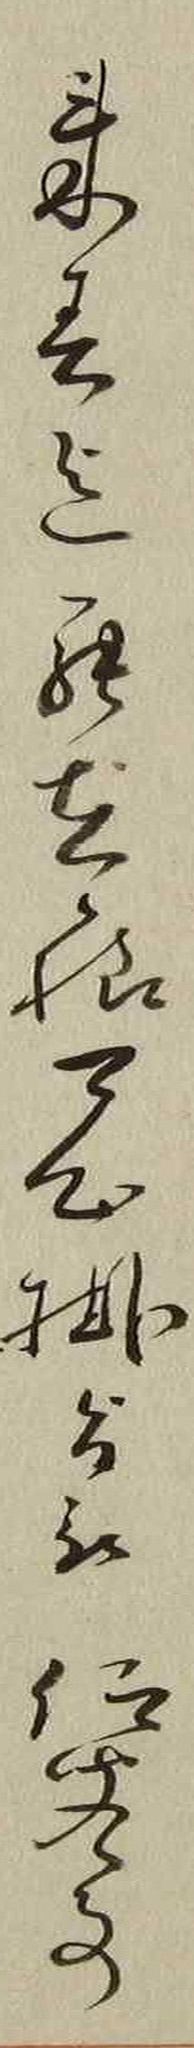来春迄罷在候様可心掛旨被仰聞候事
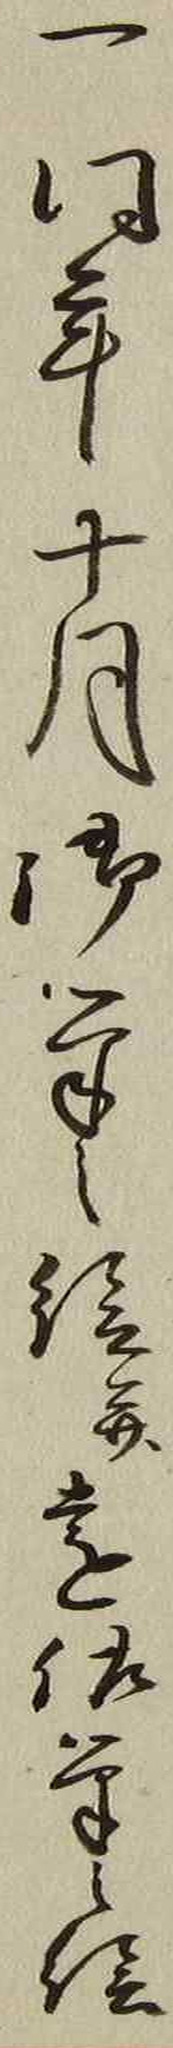一同年十月御筆之絵並遠佐筆之絵
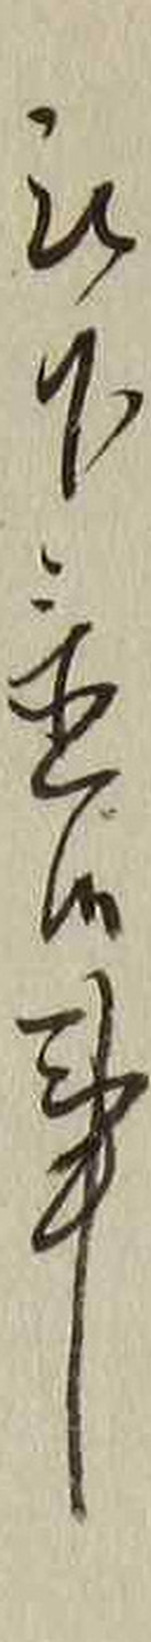被下置候事
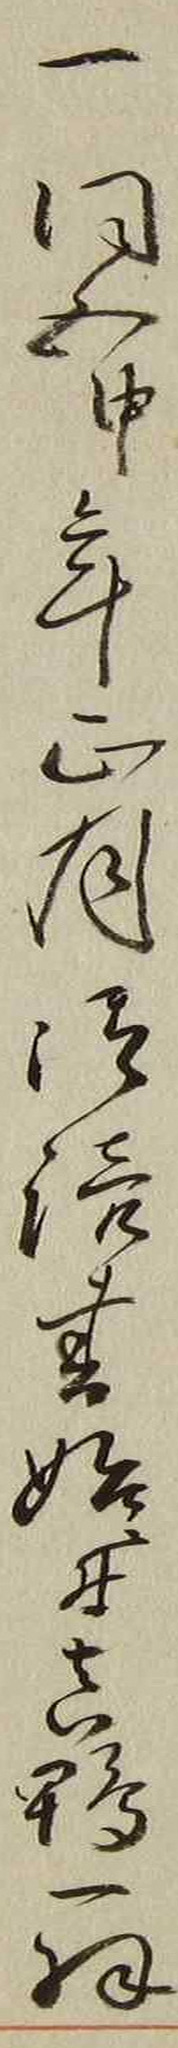一同五申年正月御読書始に付真鴨一羽
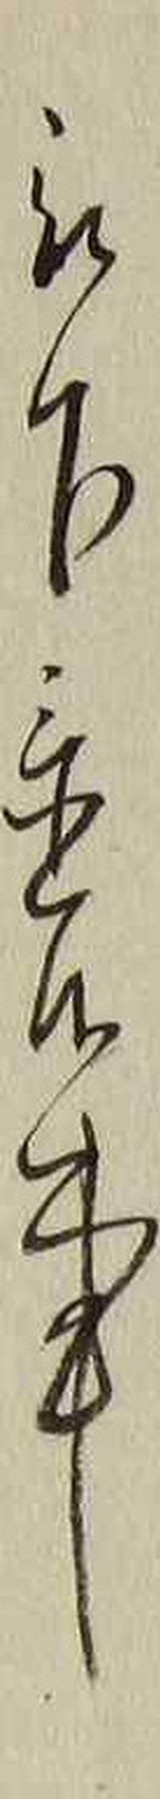被下置候事
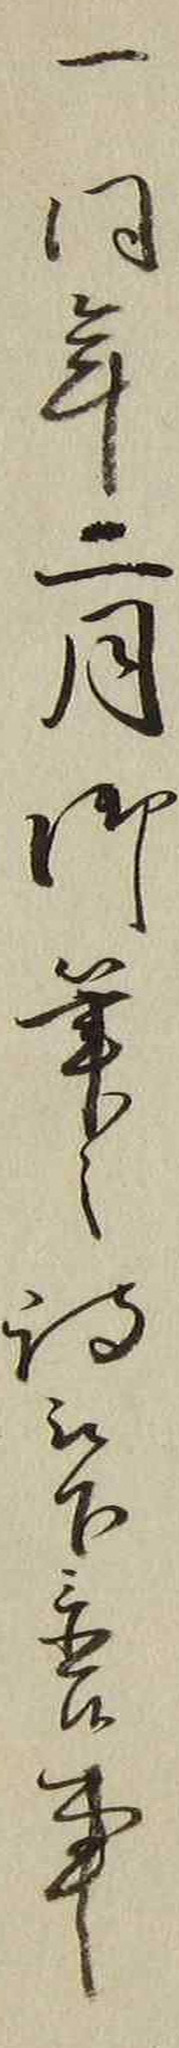一同年二月御筆之詩被下置候事
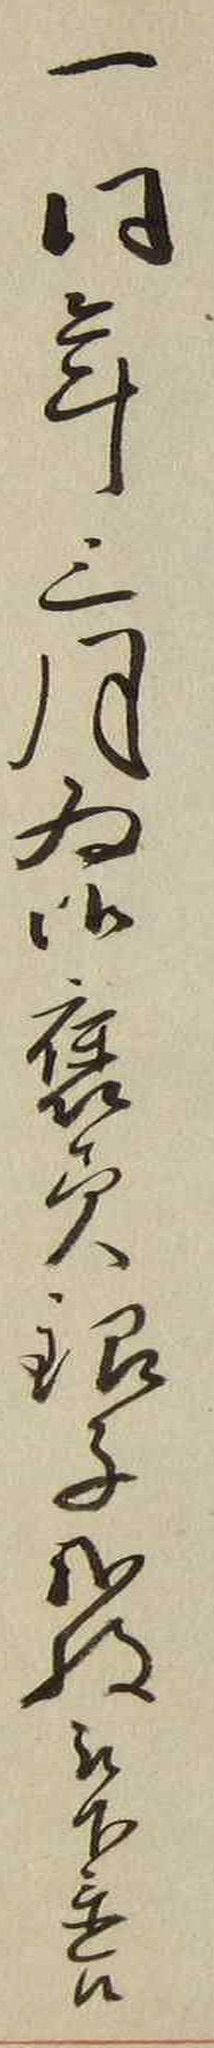一同年三月為御褒美銀子弐枚被下置候

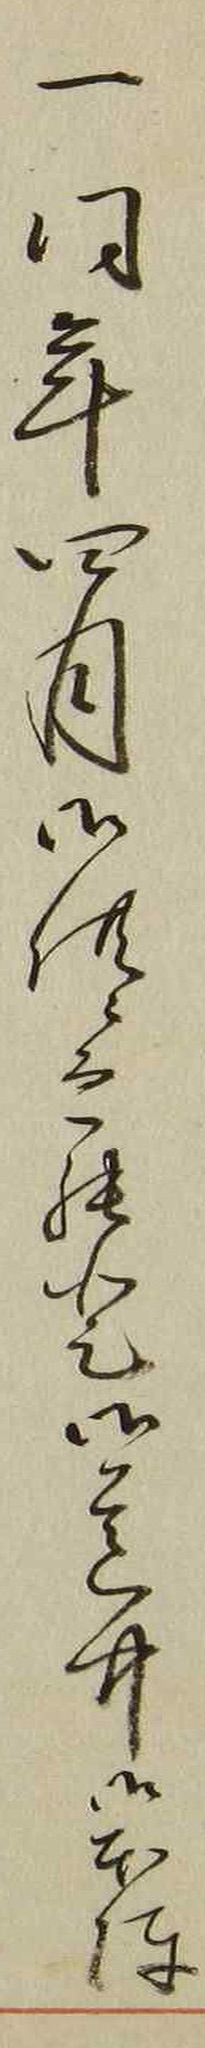一同年四月御供に而罷登御道中御本陣
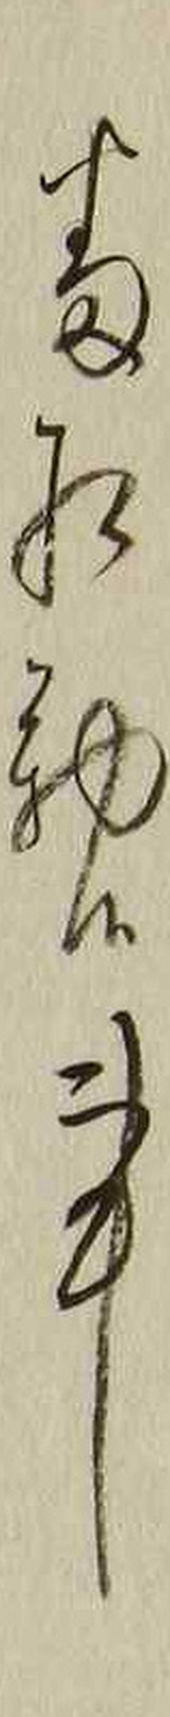番相勤候事
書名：諸士系譜　巻之3　い之部3
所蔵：会津若松市立会津図書館
